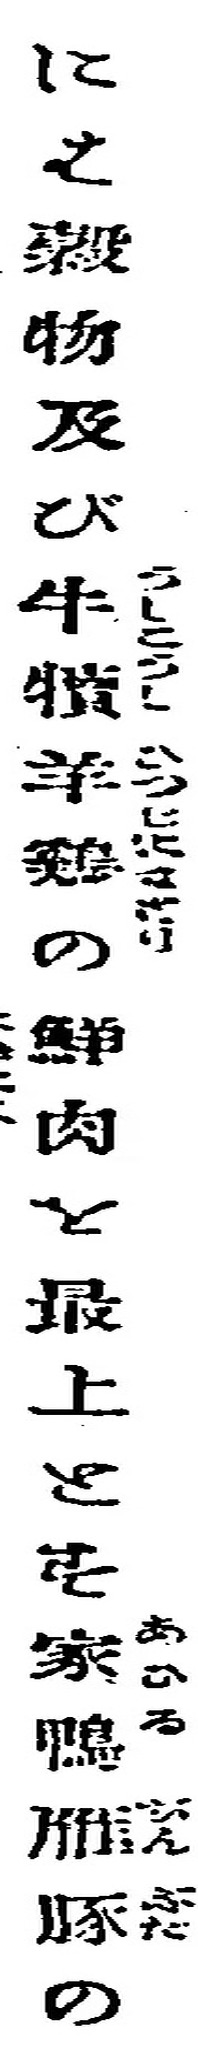には穀物及び牛犢羊鷄の鮮肉を最上とす家鴨雁豚の
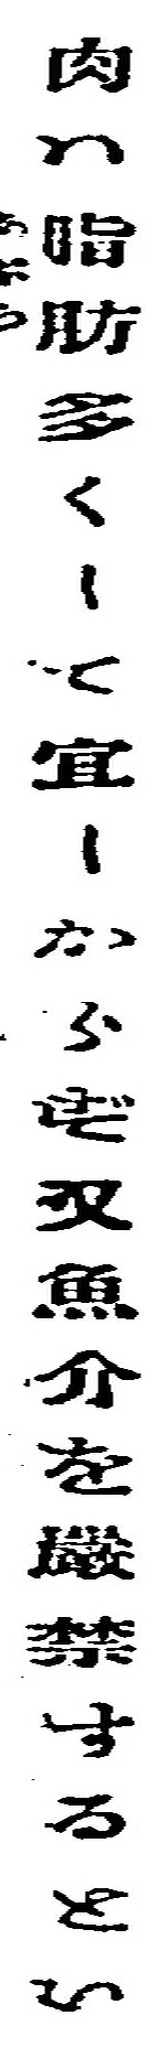肉は脂肪多くして宜しからず又魚介を厳禁するとい
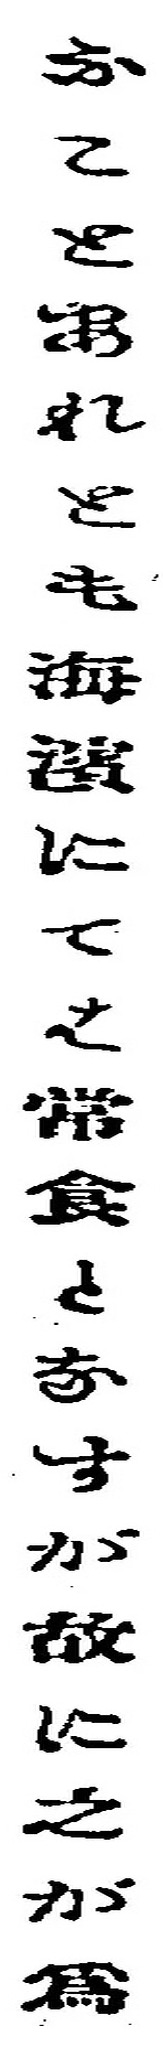ふことあれとも海浜にては常食となすが故に之が為
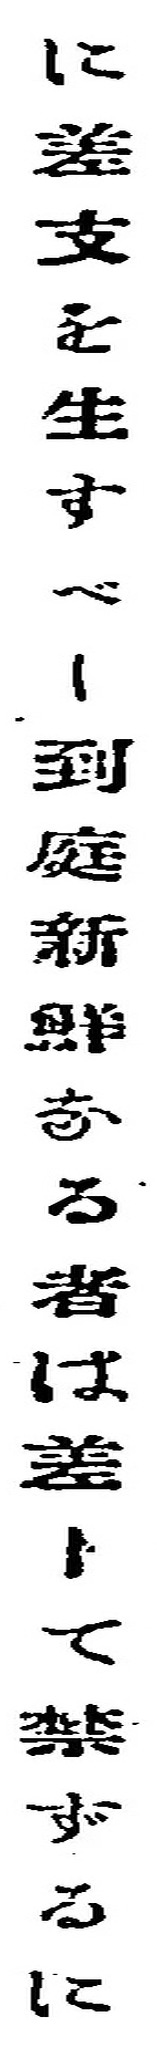に差支を生すべし到庭新鮮なる者は差して禁ずるに
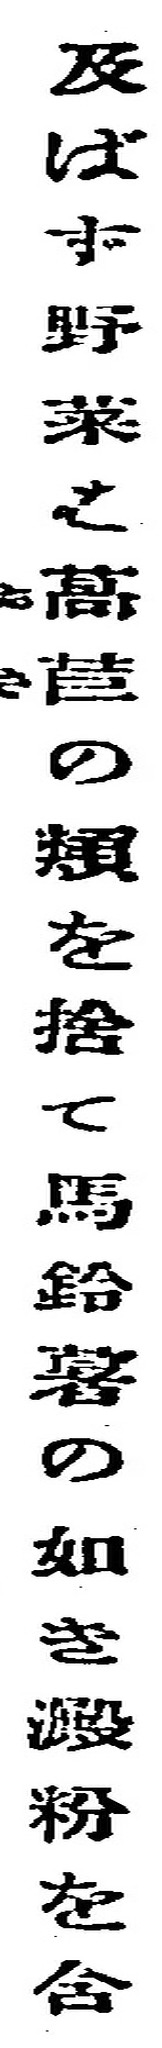及ばず野菜は萵苣の類を捨て馬鈴薯の如き澱粉を含
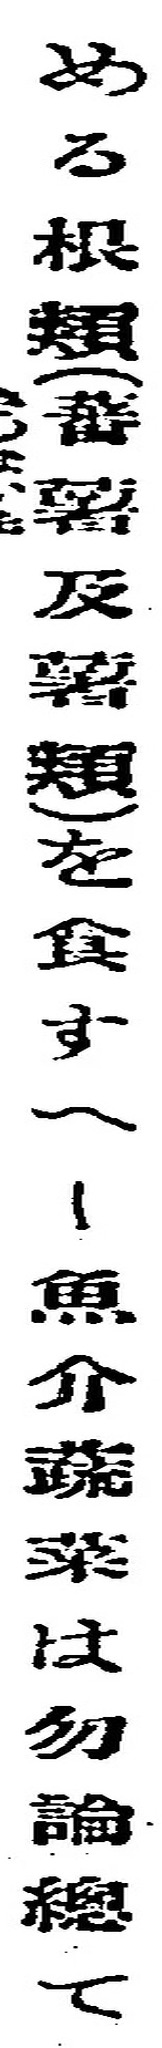める根類(蕃薯及薯類)を食すへし魚介蔬菜は勿論総て
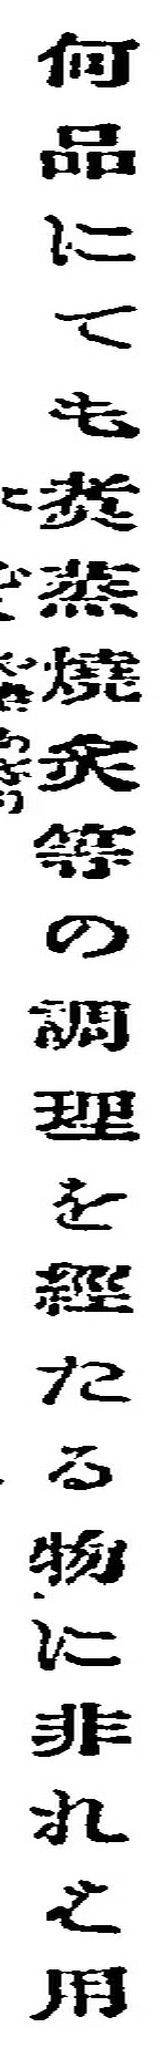何品にても煮蒸焼炙等の調理を経たる物に非れは用
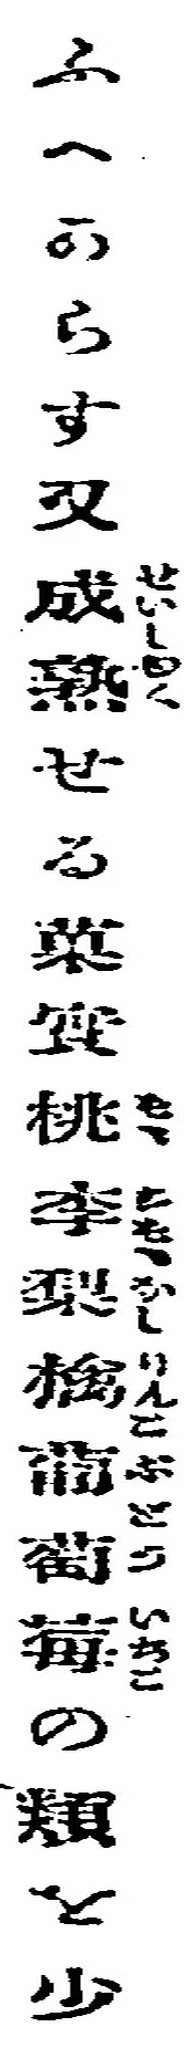ふへからす又成熟せる菓実桃李梨檎葡萄苺の類を少
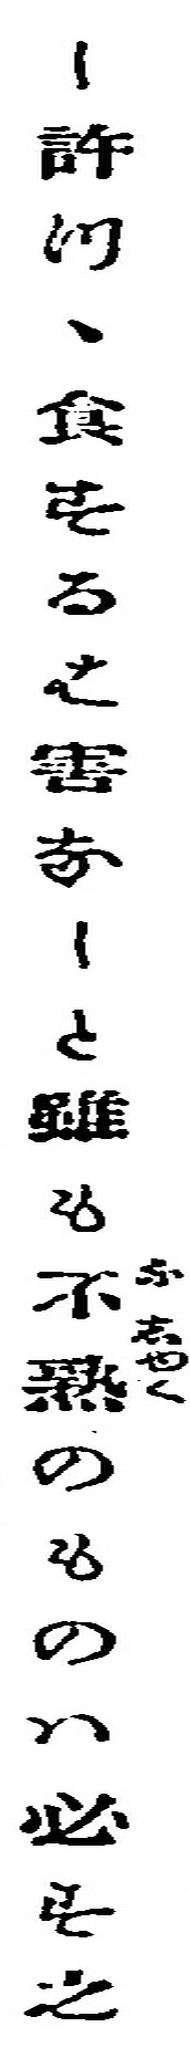し許つゝ食するは害なしと雖も不熟のものは必す之
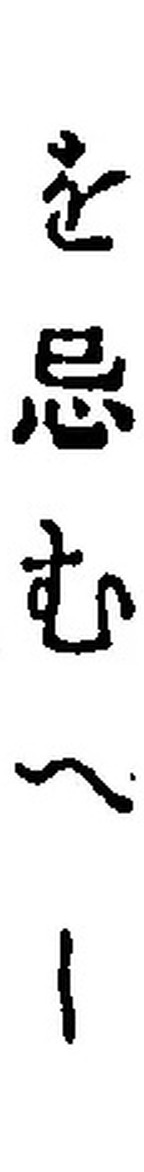を忌むへし
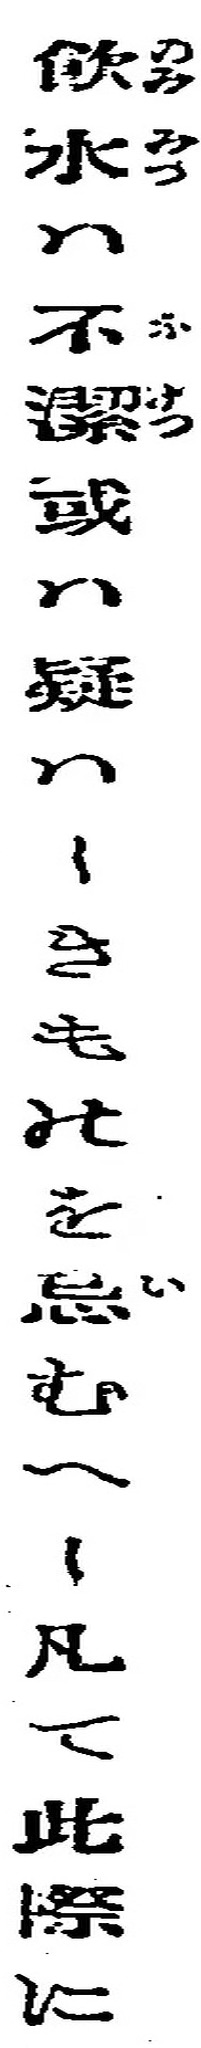飲水は不潔或は疑はしきものを忌むへし凡て此際に

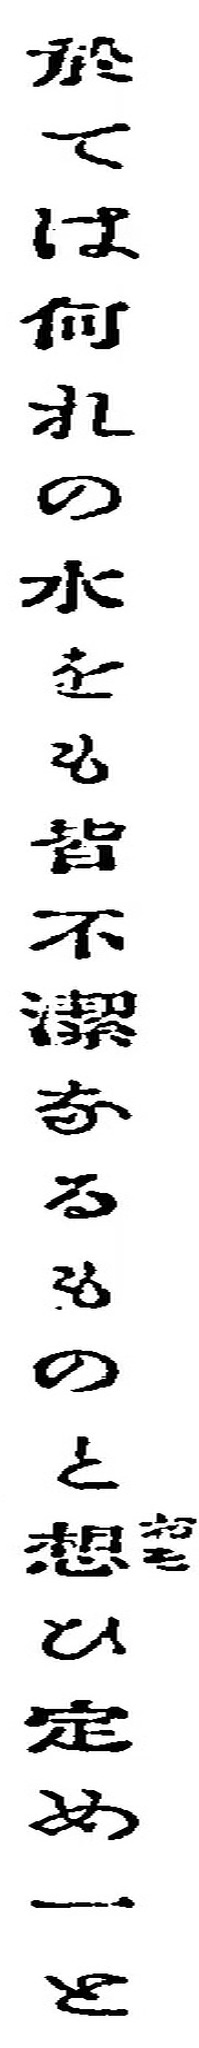於ては何れの水をも皆不潔なるものと想ひ定め一と
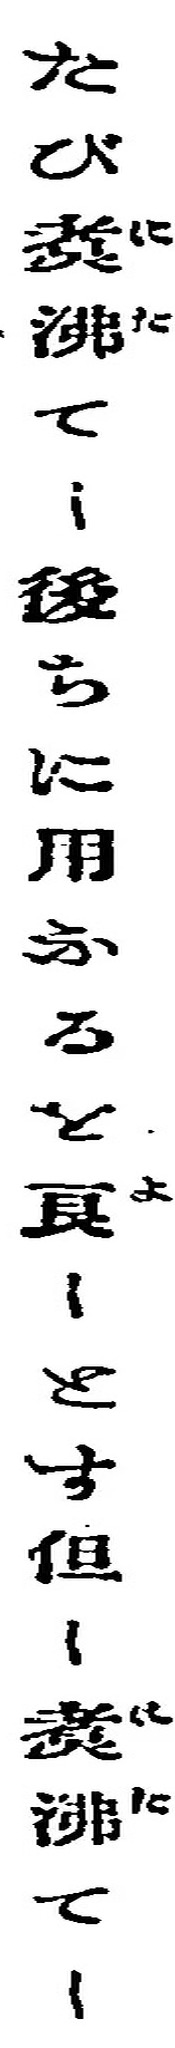たび煮沸てし後ちに用ふるを良しとす但し煮沸てし
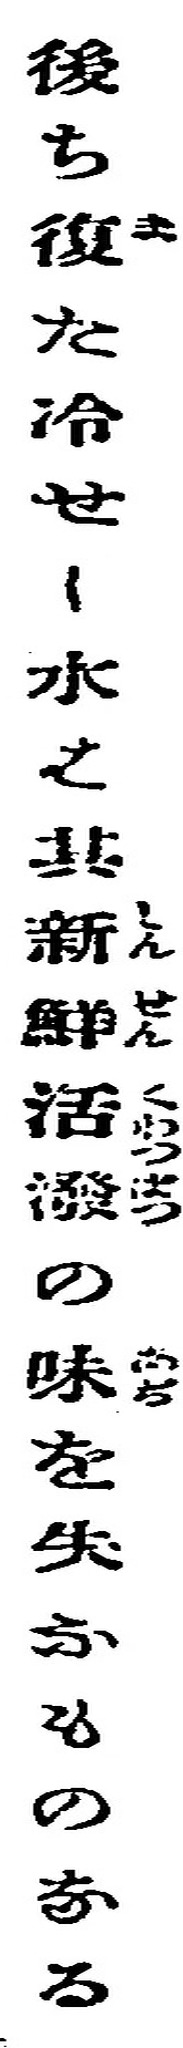後ち復た冷せし水は其新鮮活溌の味を失ふものなる
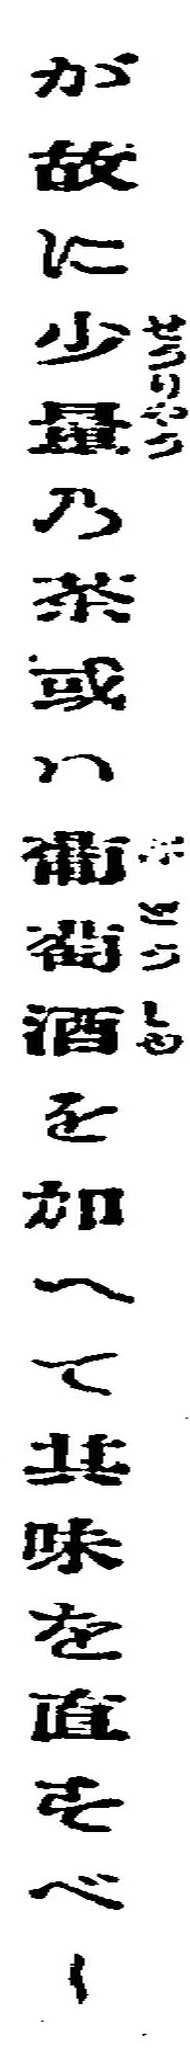が故に少量の茶或は葡萄酒を加へて其味を直すべし
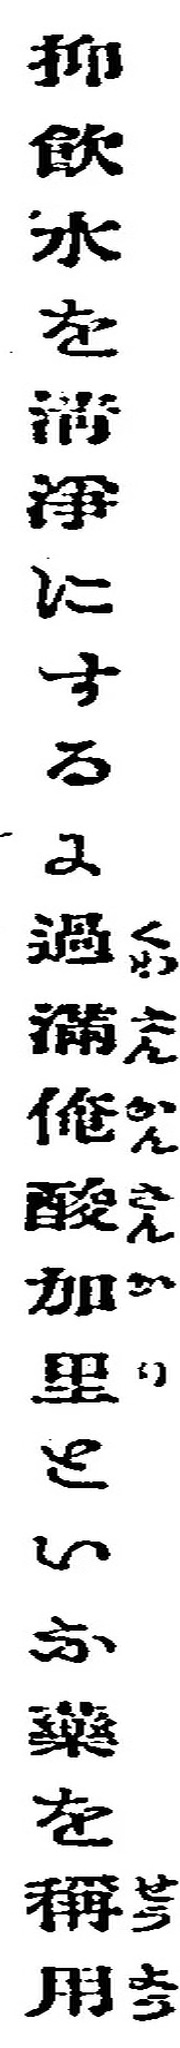抑飲水を清浄にするに過満俺酸加里といふ薬を称用
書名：これら病予防心得
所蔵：国立国会図書館 National Diet Library, JAPAN
